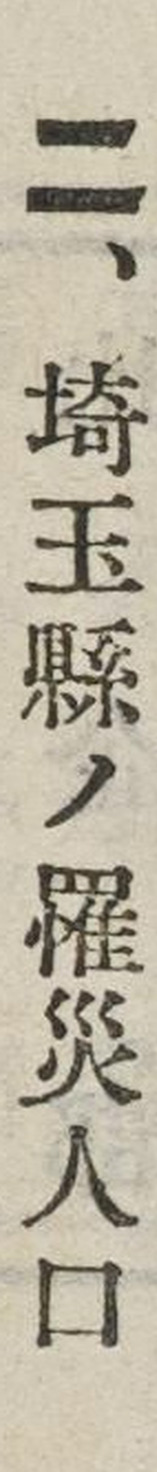ニ、埼玉県ノ罹災人口
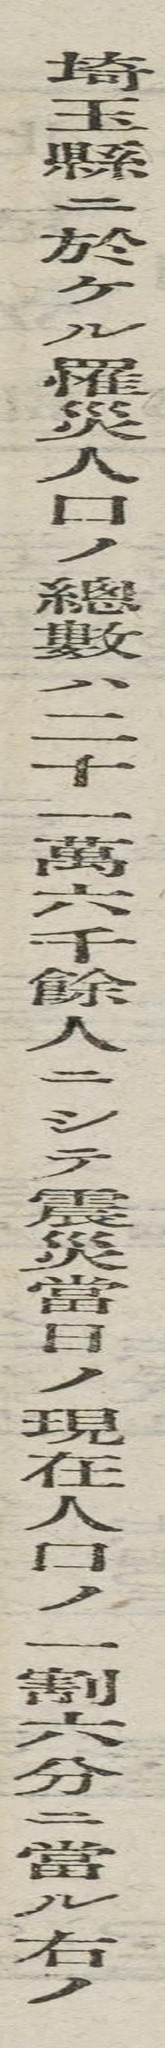埼玉県ニ於ケル罹災人口ノ総数ハ二十一万六千余人ニシテ罹災当日ノ現在人口ノ一割六分ニ当ル右ノ
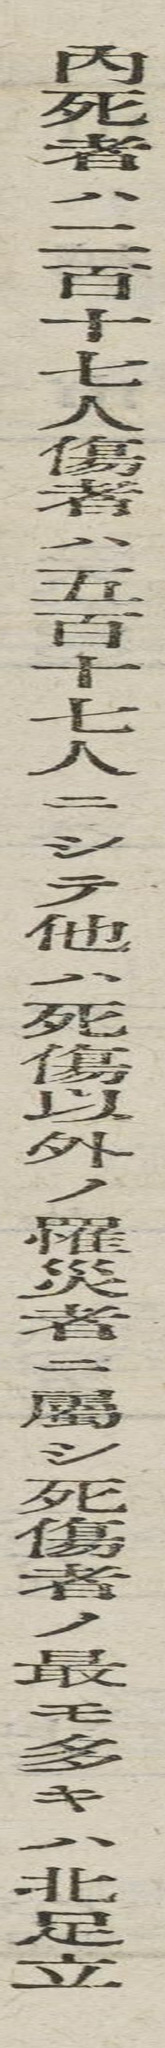内死者ハ二百十七人傷者ハ五百十七人ニシテ他ハ死傷以外ノ罹災者ニ属シ死傷者ノ最モ多キハ北足立
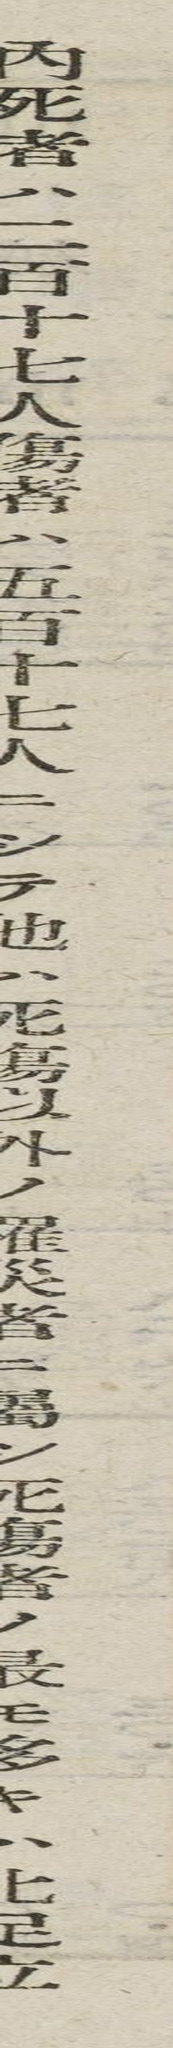内死者ハ二百十七人傷者ハ五百十七人ニシテ他ハ死傷以外ノ罹災者ニ属シ死傷者ノ最モ多キハ北足立
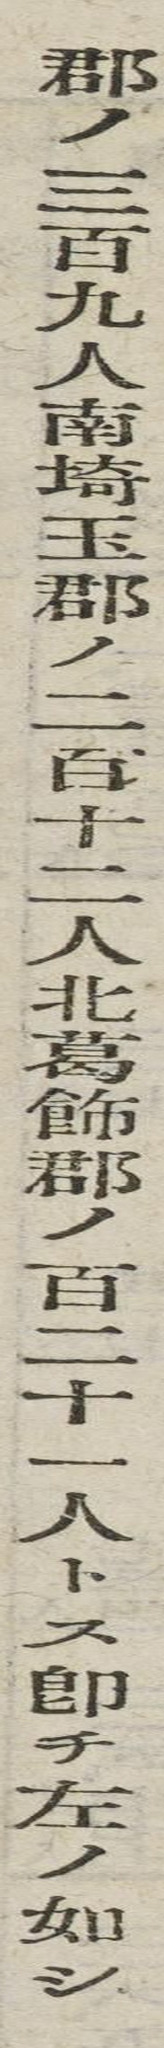郡ノ三百九人南埼玉郡ノ二百十二人北葛飾郡ノ百二十一人トス即チ左ノ如シ
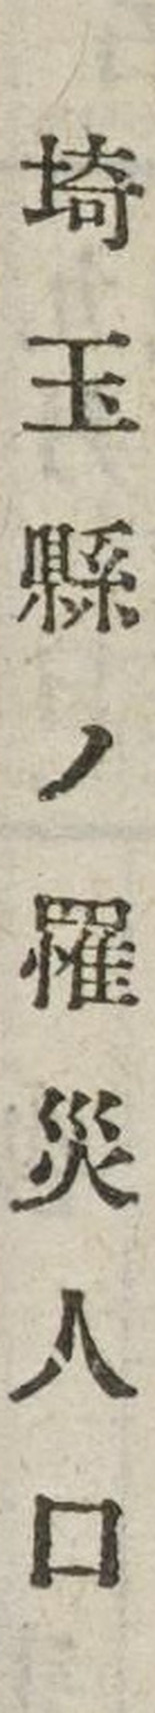埼玉県ノ罹災人口

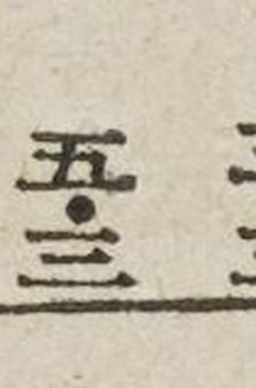五――
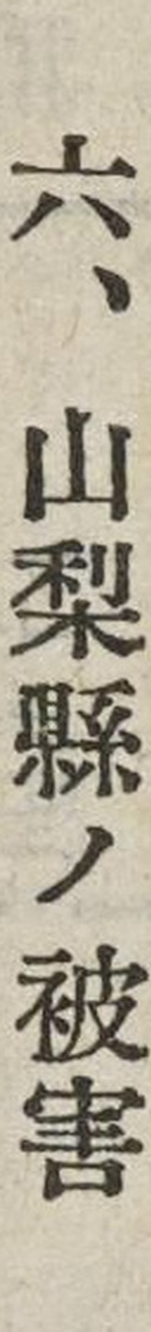六、山梨県ノ被害
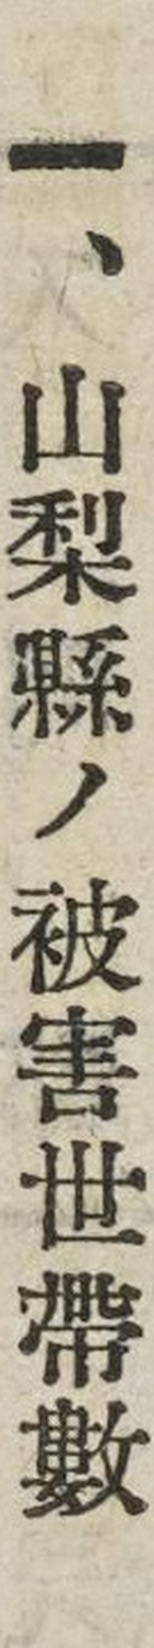一、山梨県ノ被害世帯数
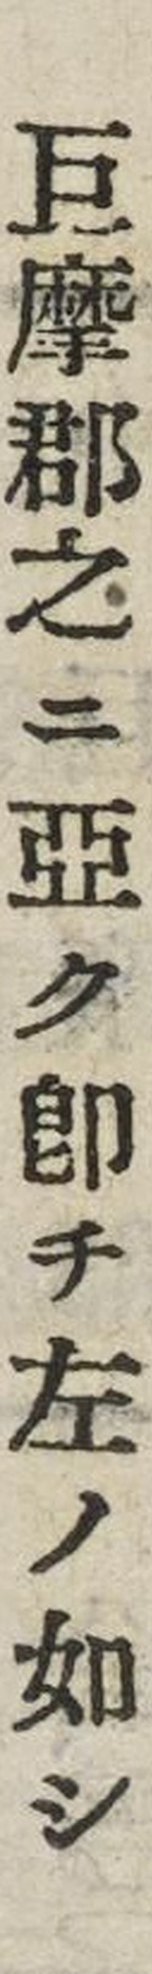巨摩郡之ニ亜ク即チ左ノ如シ
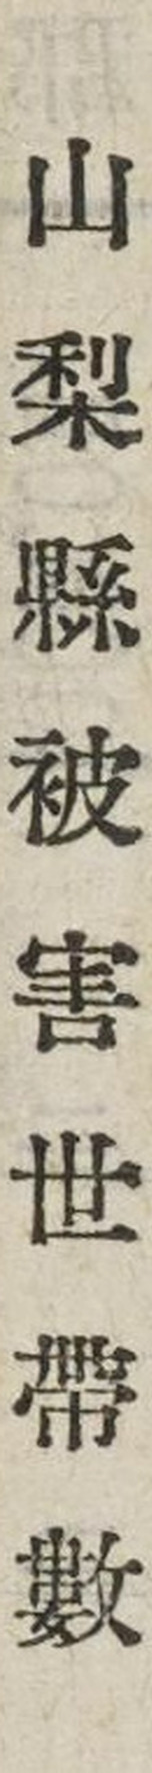山梨県被害世帯数

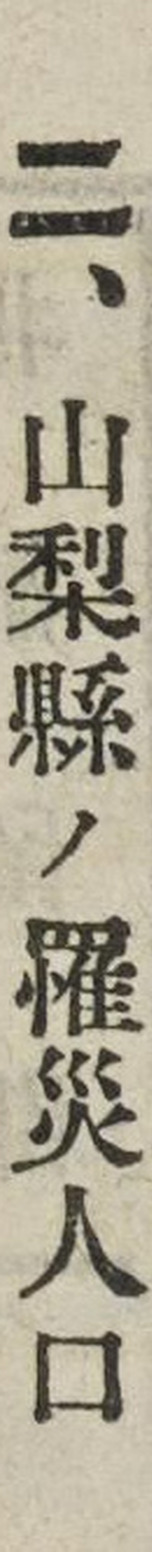ニ、山梨県ノ罹災人口
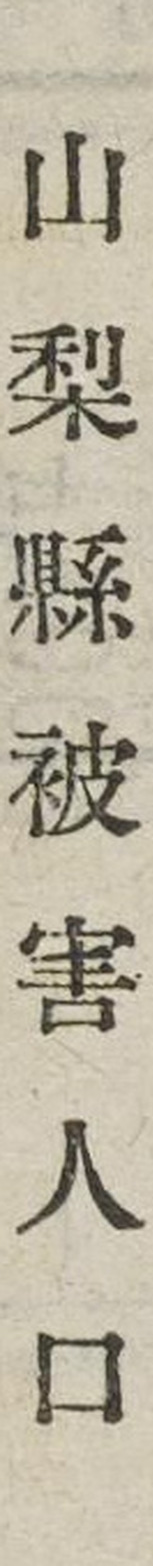山梨県被害人口
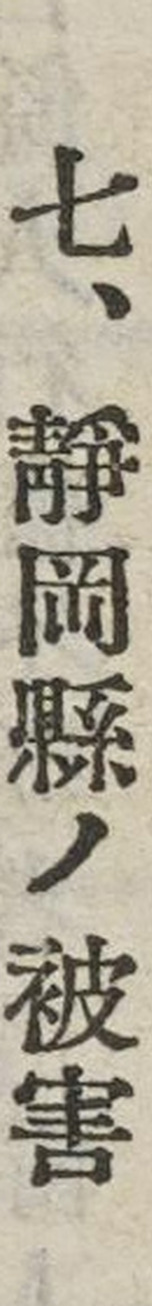七、静岡県ノ被害
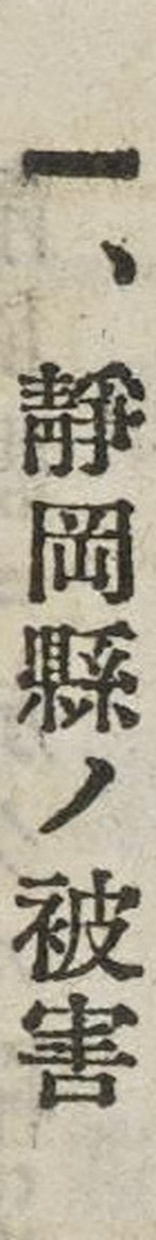一、静岡県ノ被害
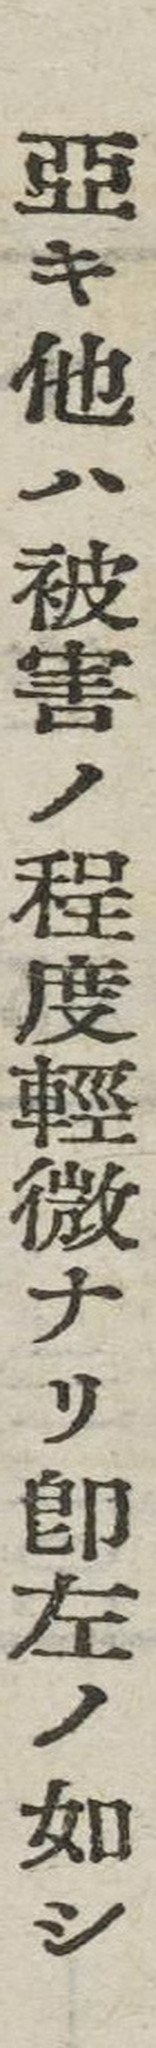亜キ他ハ被害ノ程度軽微ナリ即左ノ如シ
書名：震災被害状況並救護施設概要
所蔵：東京大学地震研究所図書室 Earthquake Research Institute Library, The University of Tokyo, JAPAN
